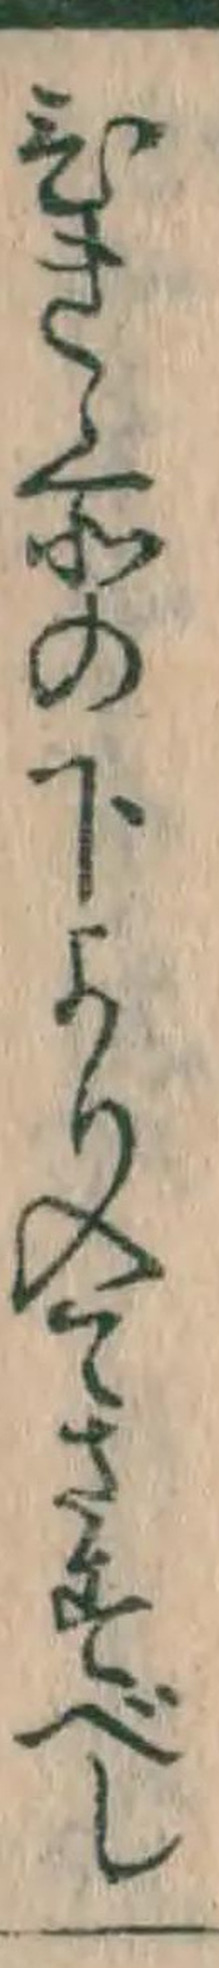ひきゝ所の下より入てさすべし
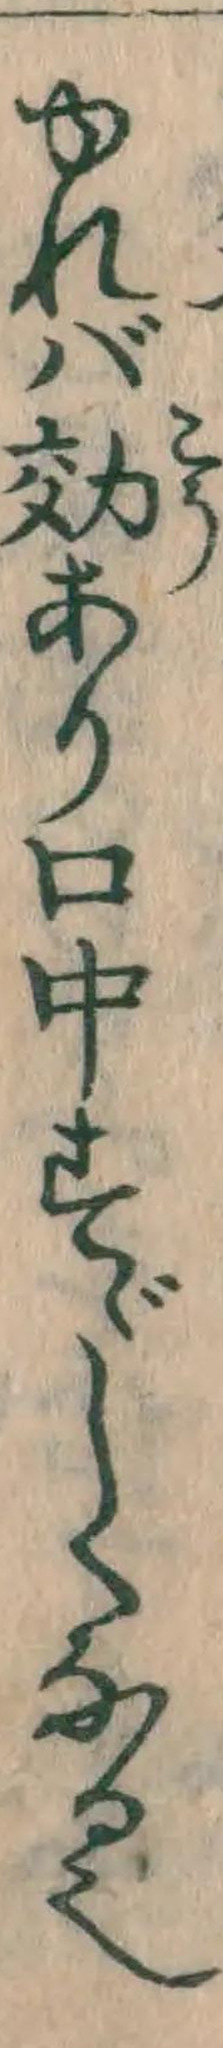ゆれば効あり口中すゞしくなる也

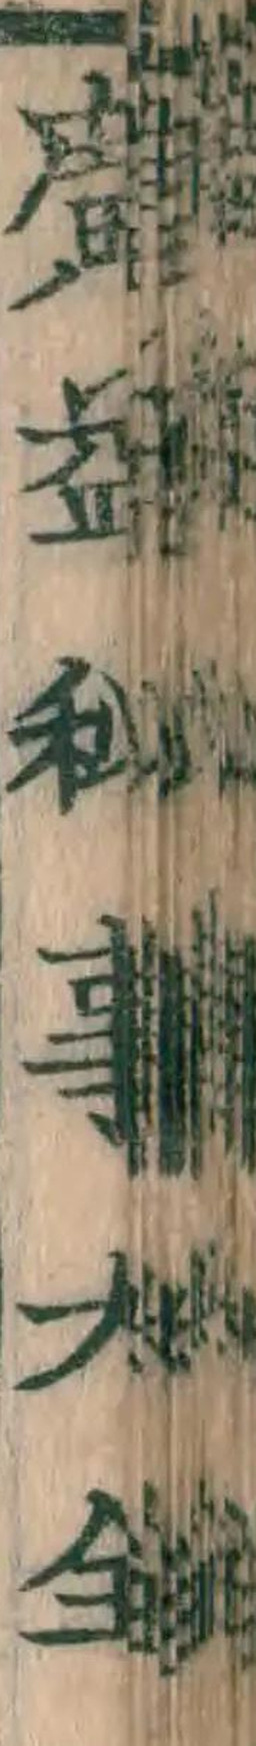広益秘事大全
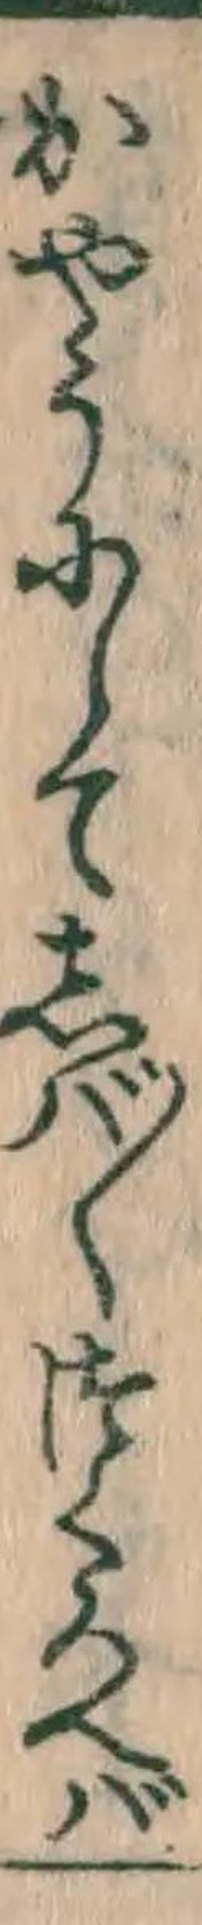かやうにしてしば〳〵つくろへば
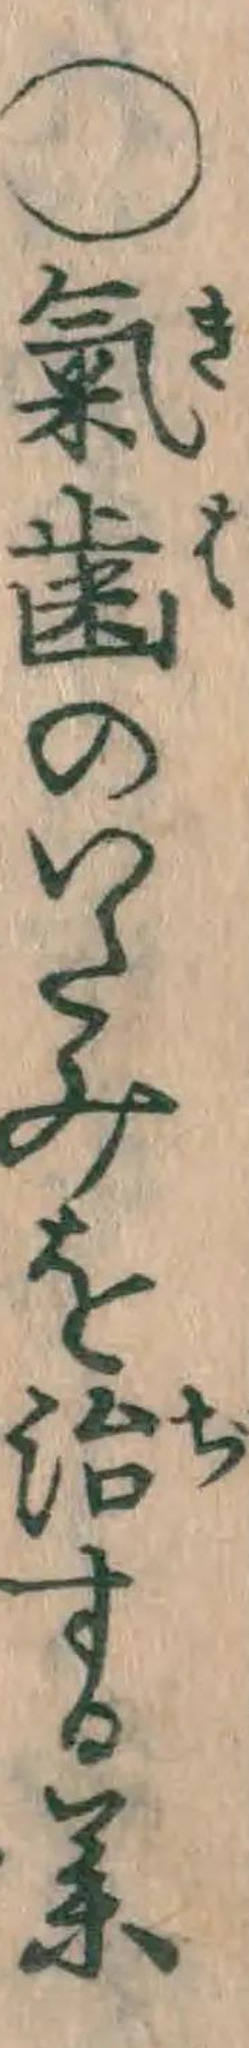○気歯のいたみを治する薬
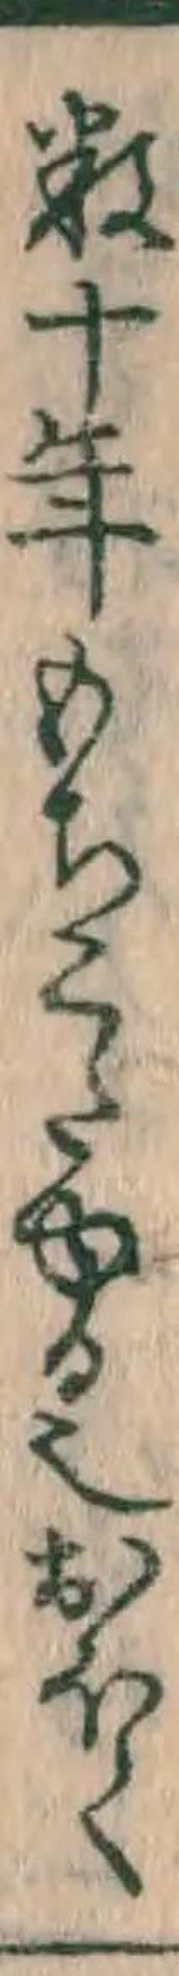数十年もちこたゆる也おほく
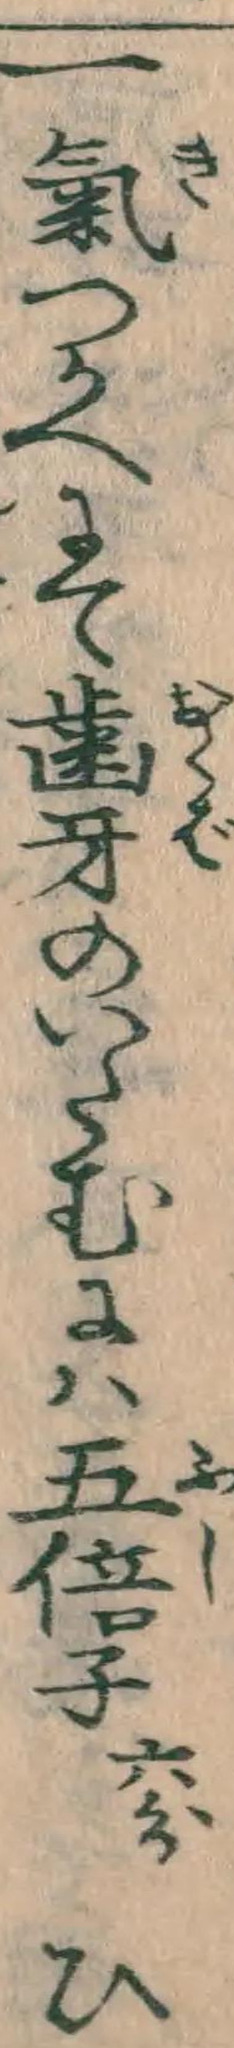一気つかへにて歯牙のいたむには五倍子六分ひ
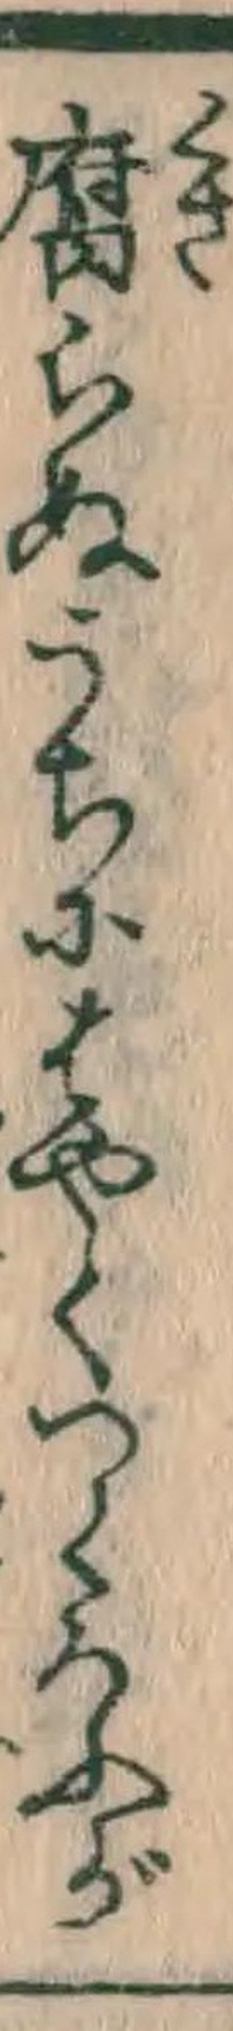腐らぬうちにはやくつくろふが
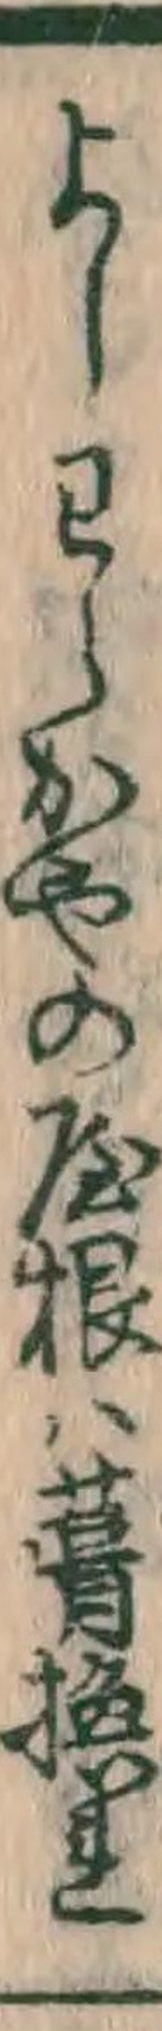よしわらかやの屋根は葺換れ
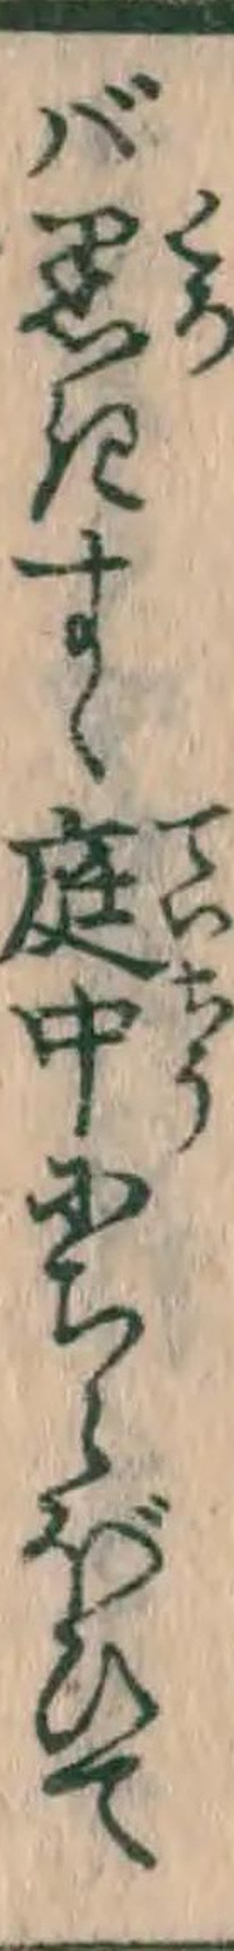ば黒きすゝ庭中にちらぼひて
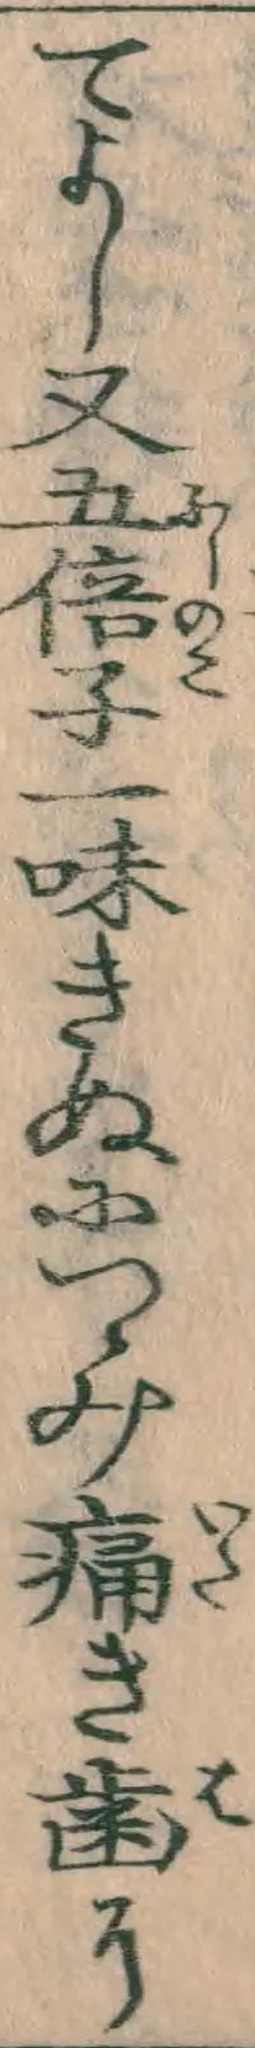てよし又五倍子一味きぬにつゝみ痛き歯に
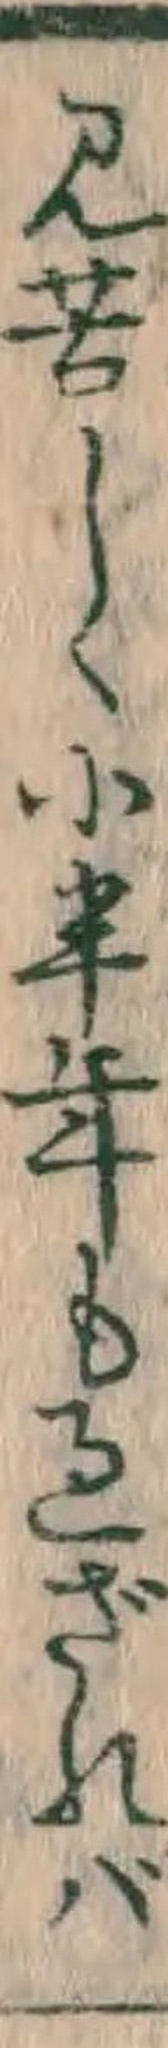見苦しく小半年も過ざれば
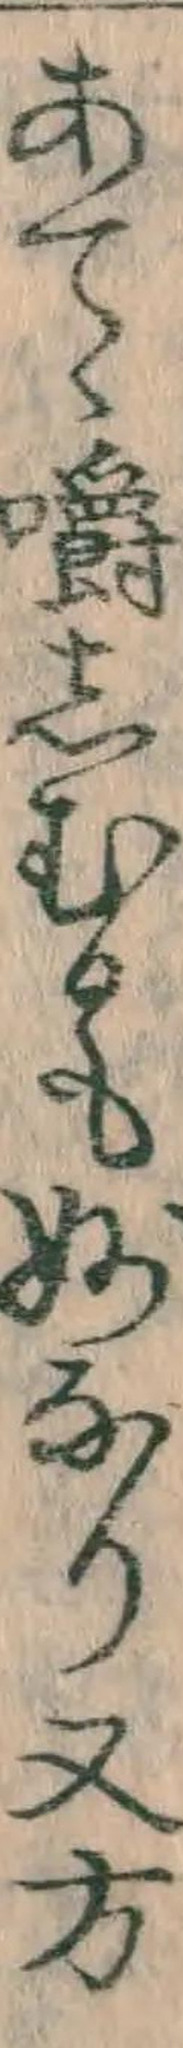あてゝ嚼しむるも妙なり又方
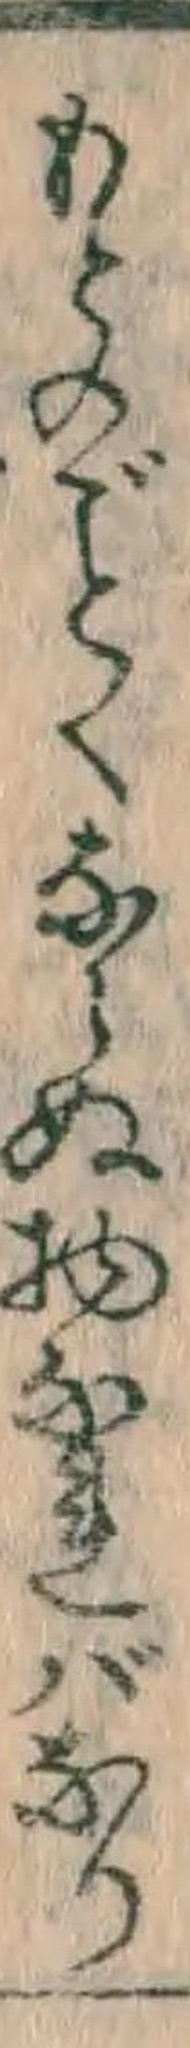もとのごとくならぬ物なればなり
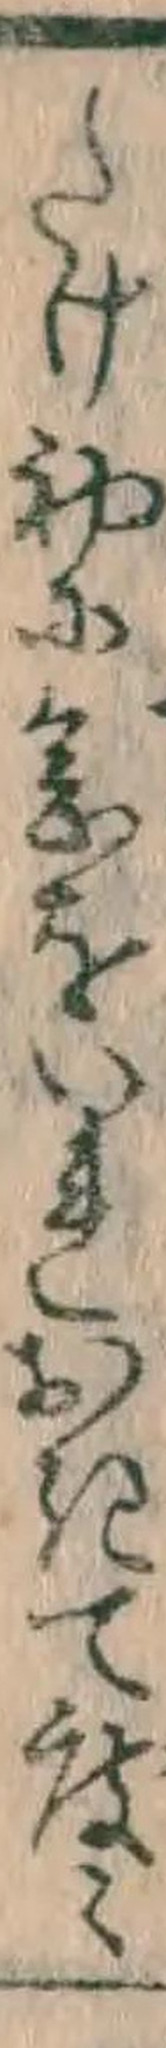たけ初に念をいれおきて度々
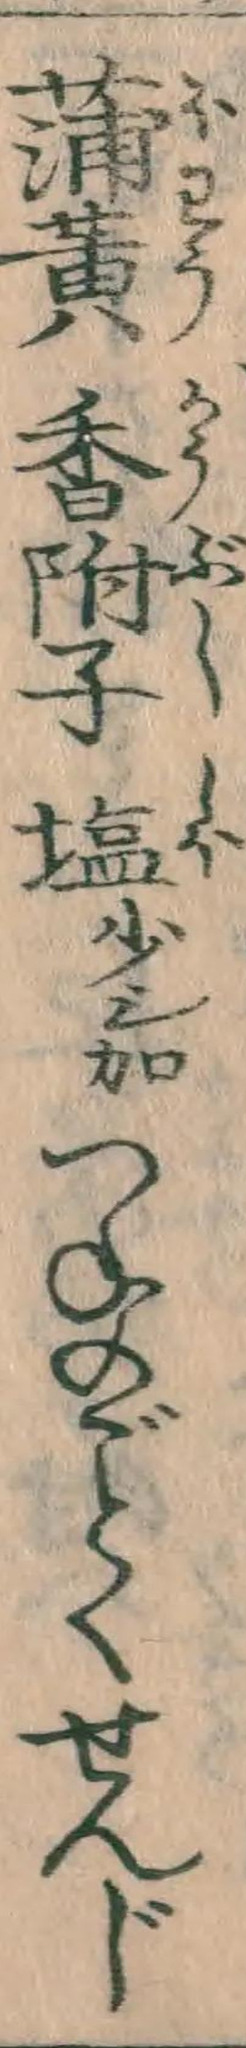蒲黄香附子塩少シ加つねのごとくせんじ
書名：広益秘事大全 3巻. [3]
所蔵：国立国会図書館 National Diet Library, JAPAN
